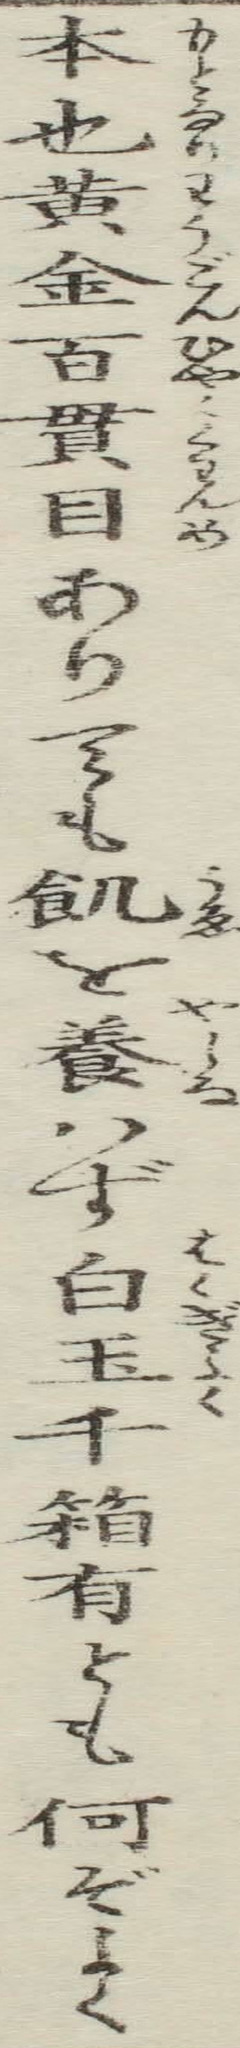本也黄金百貫目ありても飢を養はず白玉千箱有とも何ぞよく
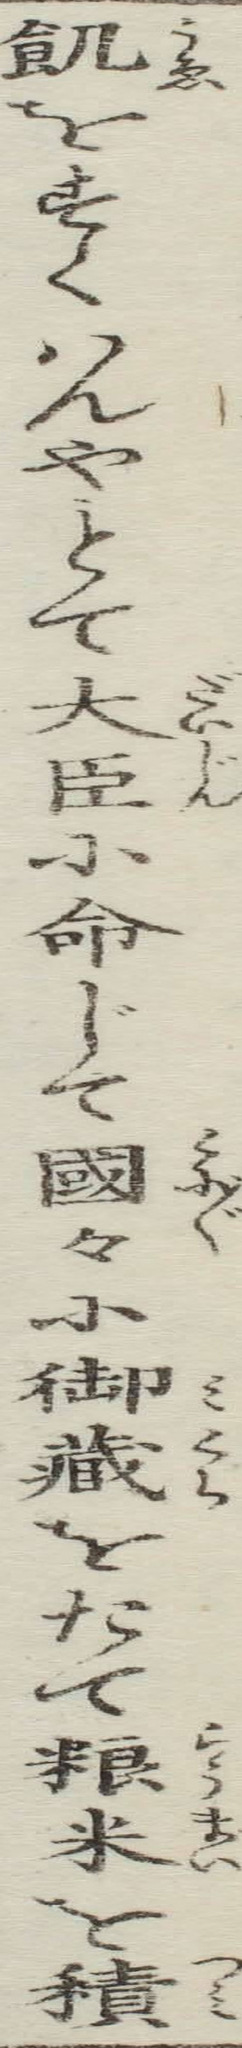飢をすくはんやとて大臣に命じて国々に御蔵をたて粮米を積
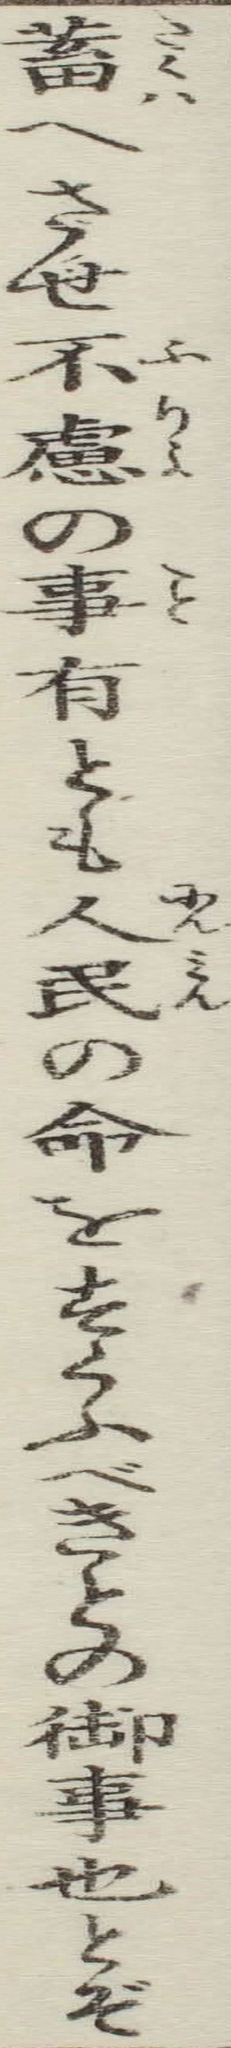蓄へさせ不慮の事有とも人民の命をすくふべきとの御事也とぞ
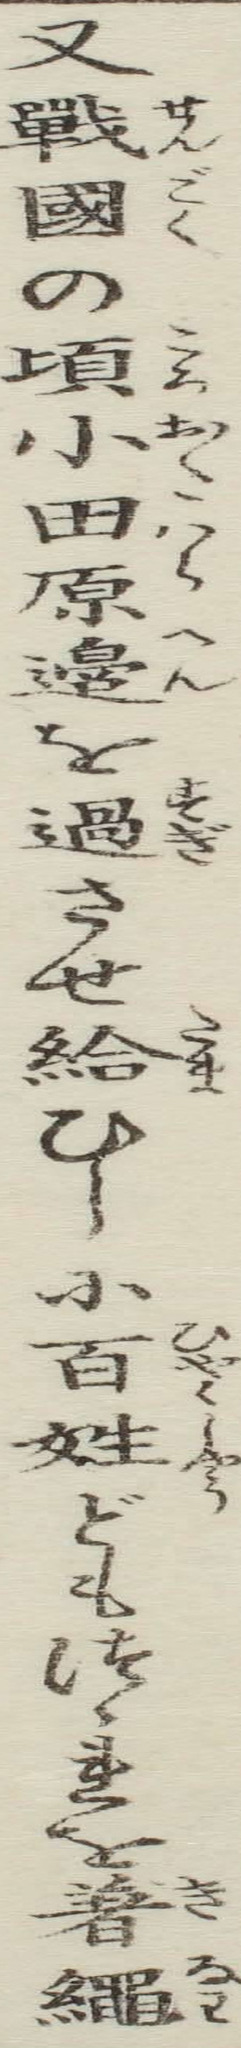又戦国の頃小田原辺を過させ給ひしに百姓どもつゝれを着縄
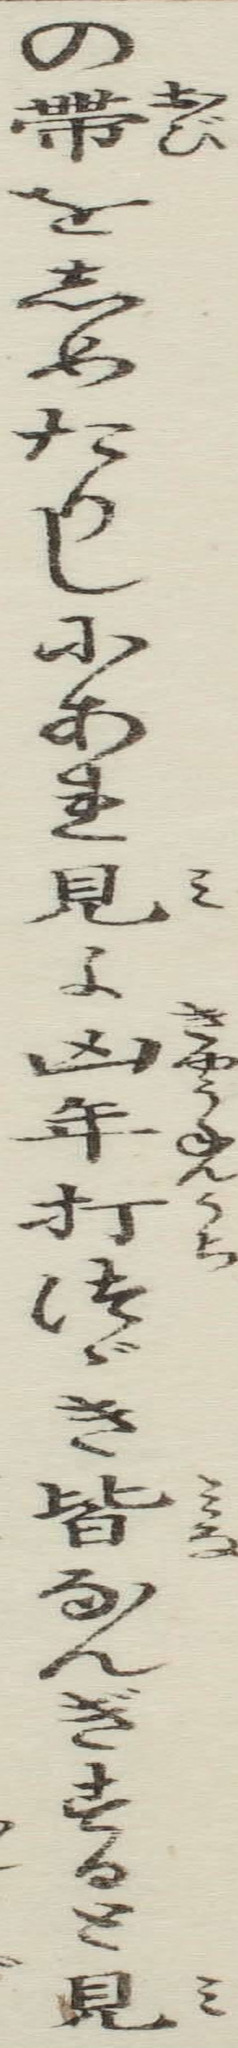の帯をしめたりしにあれ見よ凶年打つゞき皆なんぎすると見
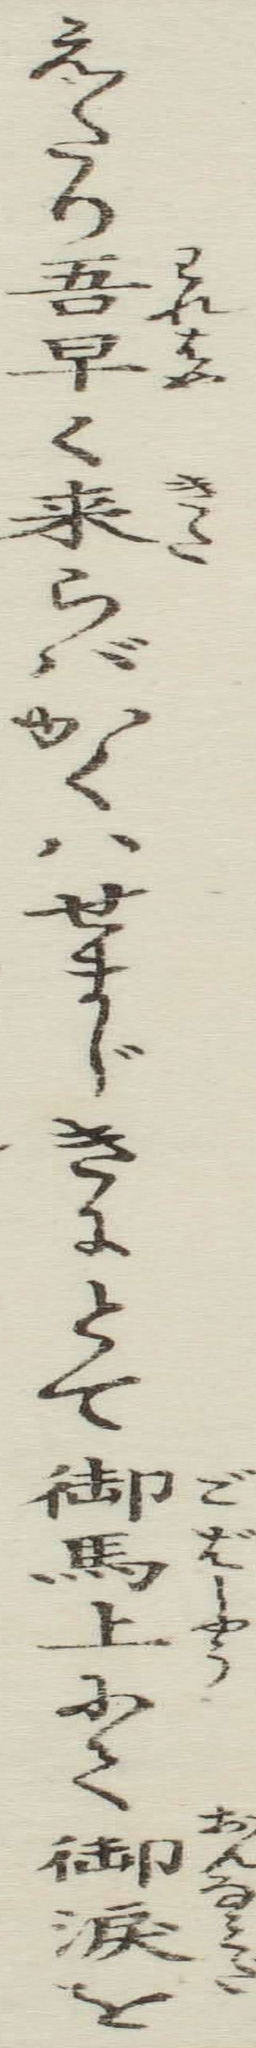えたり吾早く来らばかくはせまじきにとて御馬上にて御涙を
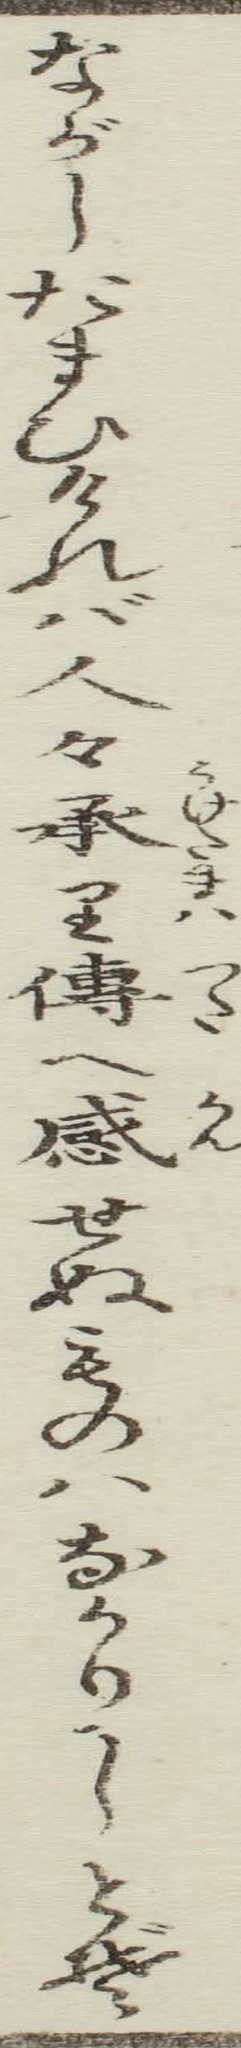ながしたまひければ人々承り伝へ感せぬものはなかりしとぞ
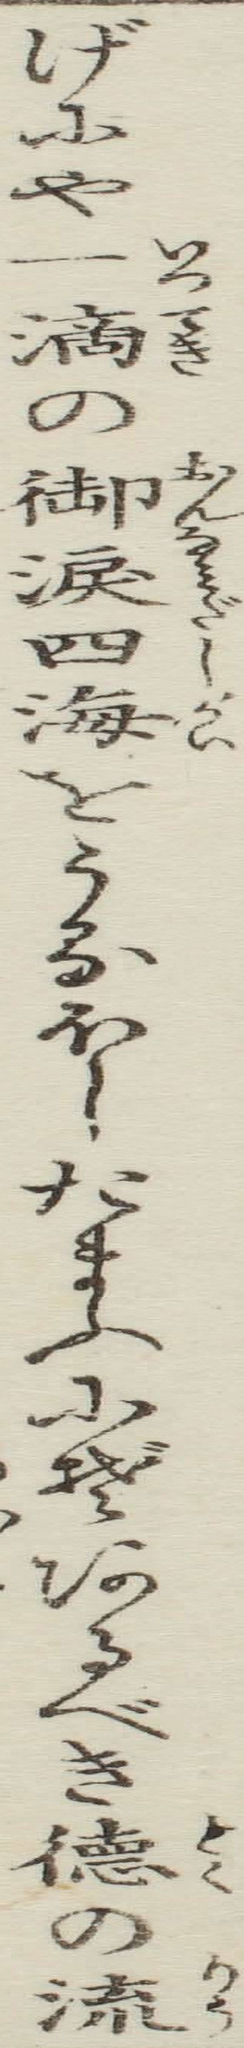げにや一滴の御涙四海をうるほしたまふにぞあるべき徳の流
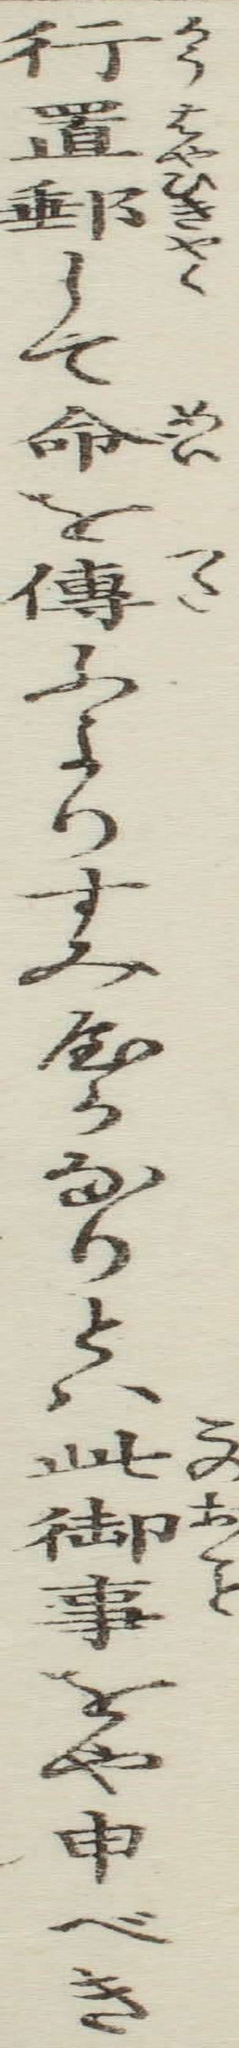行置郵して命を伝ふよりすみやかなりとは此御事をや申べき
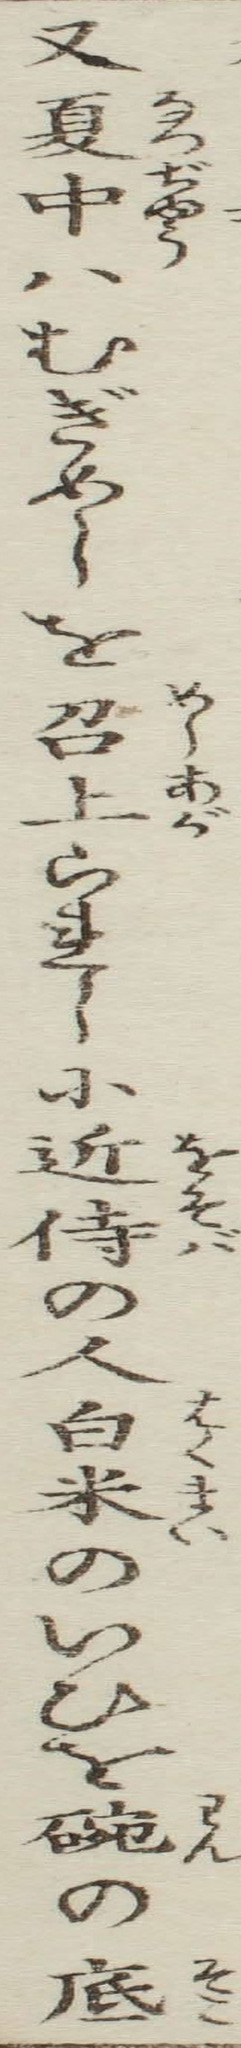又夏中はむぎめしを召上られしに近侍の人白米のいひを碗の底

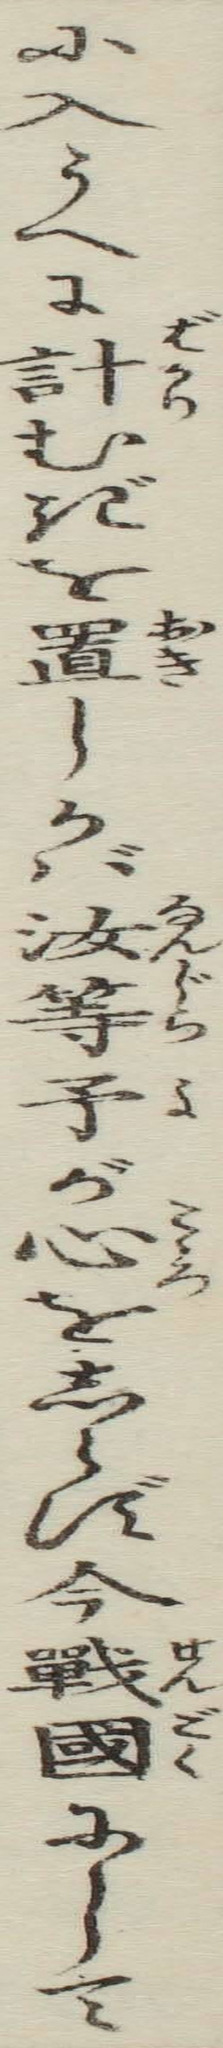に入うへに計むぎを置しかば汝等予が心をしらず今戦国にして
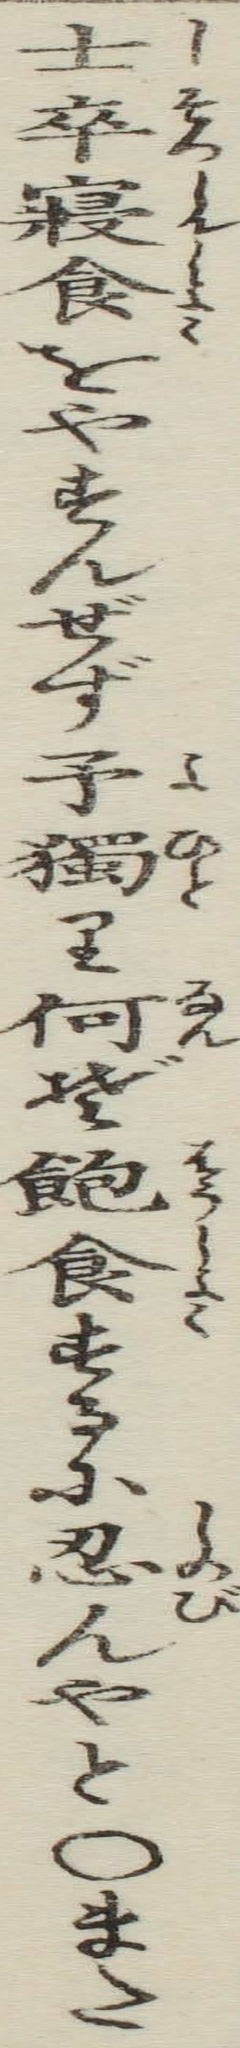士卒寝食をやすんぜず予独り何ぞ飽食するに忍んやと○また
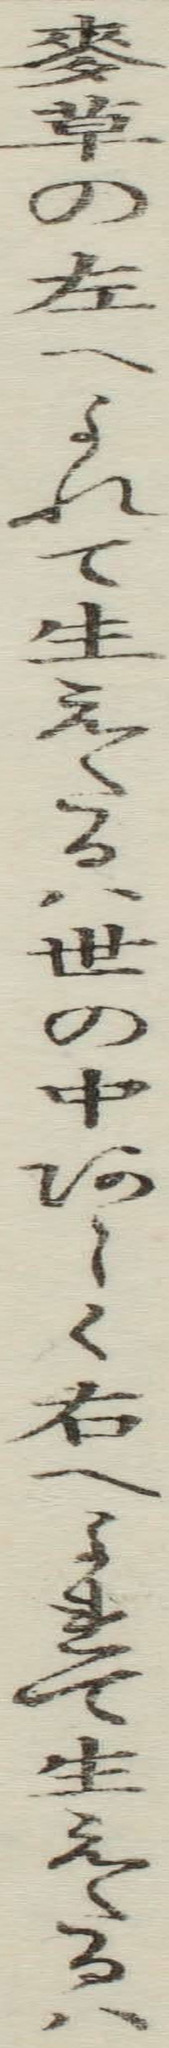麦草の左へよれて生えたるは世の中あしく右へよれて生えたるは
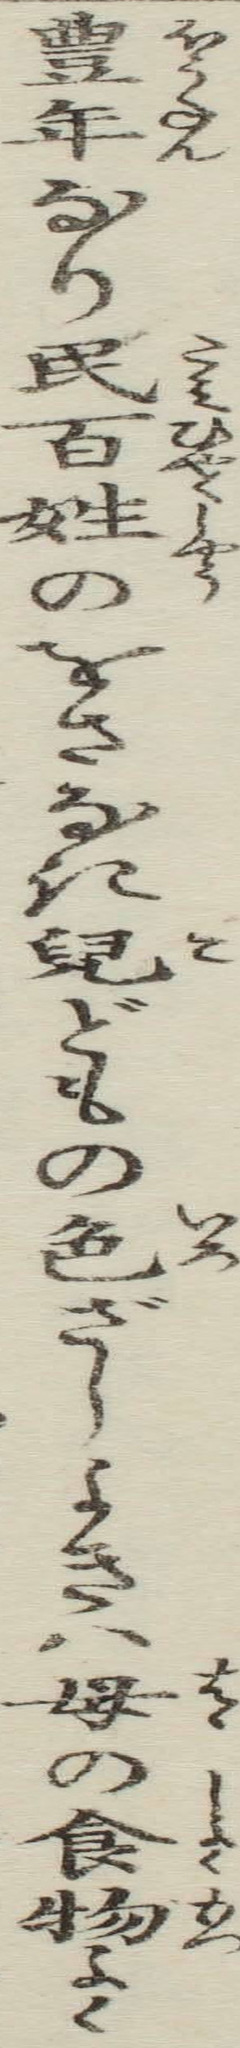豊年なり民百姓のをさなき兒どもの色ざしよきは母の食物よく
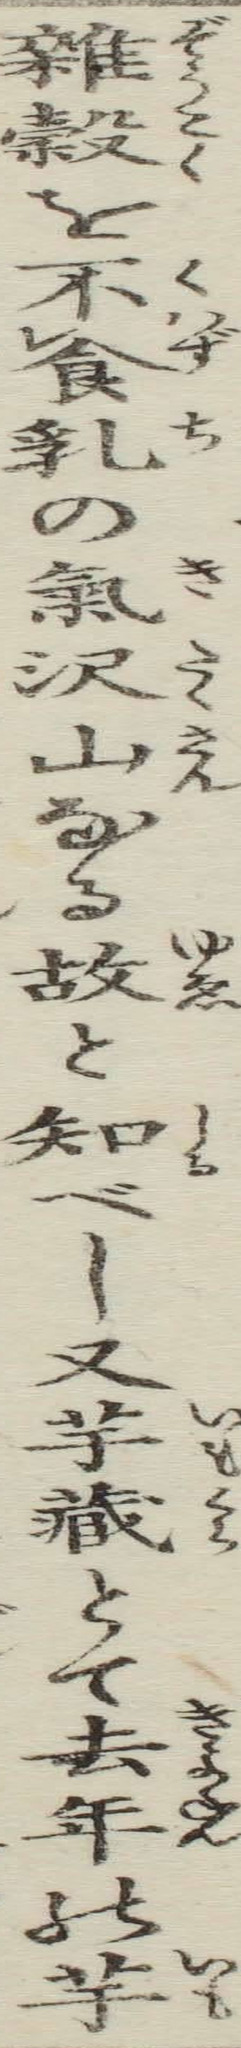雑穀を不食乳の気沢山なる故と知べし又芋蔵とて去年の芋
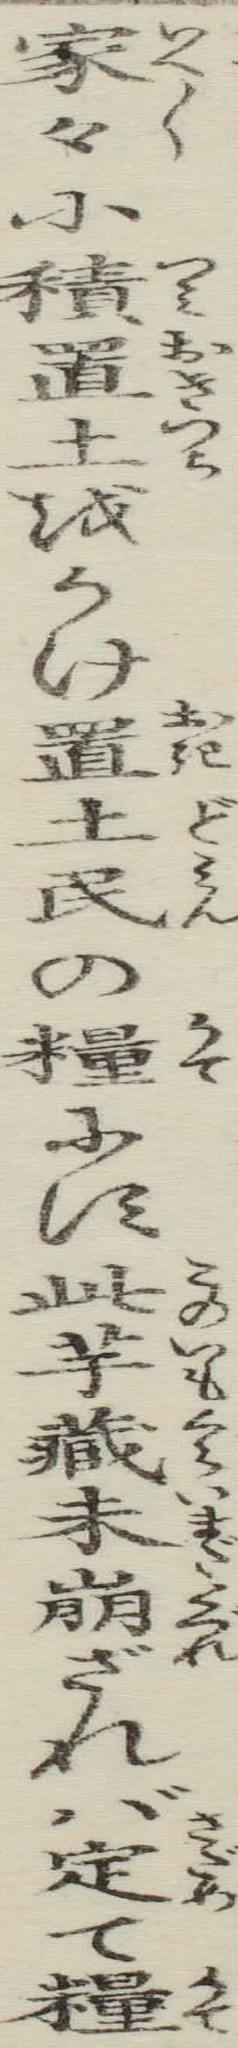家々に積置土をかけ置土民の糧にす此芋蔵未崩ざれば定て糧
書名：救荒便覧
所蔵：国文学研究資料館
